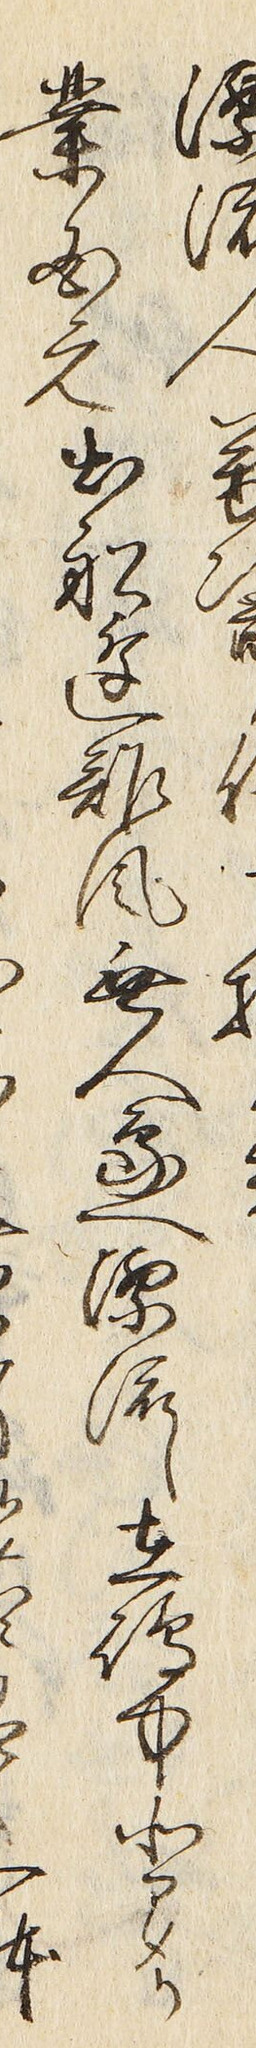業国元出船逢難風無人島へ漂流し在嶋中北アメリ
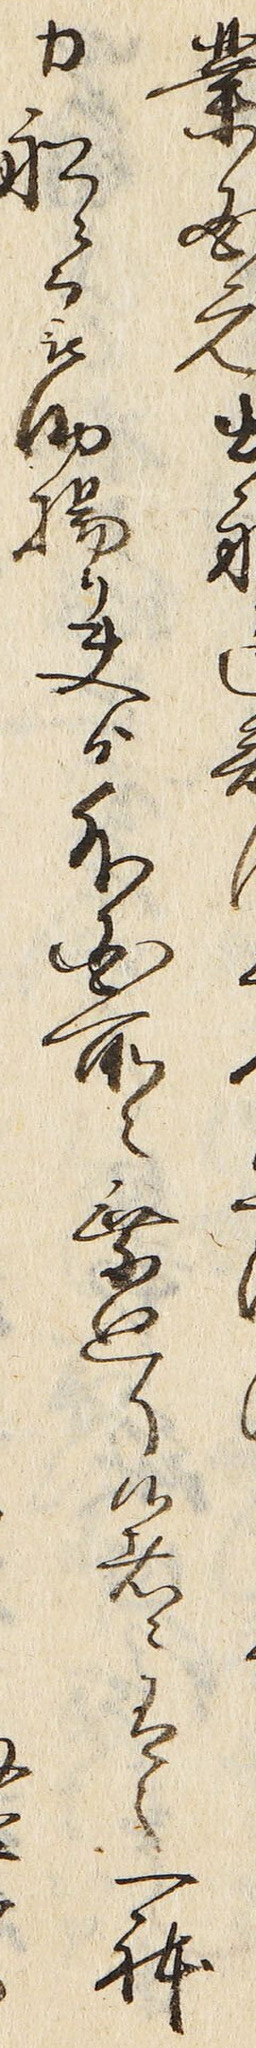カ船に而被助揚り夫ゟ外国所々乗廻り候者に有之一躰
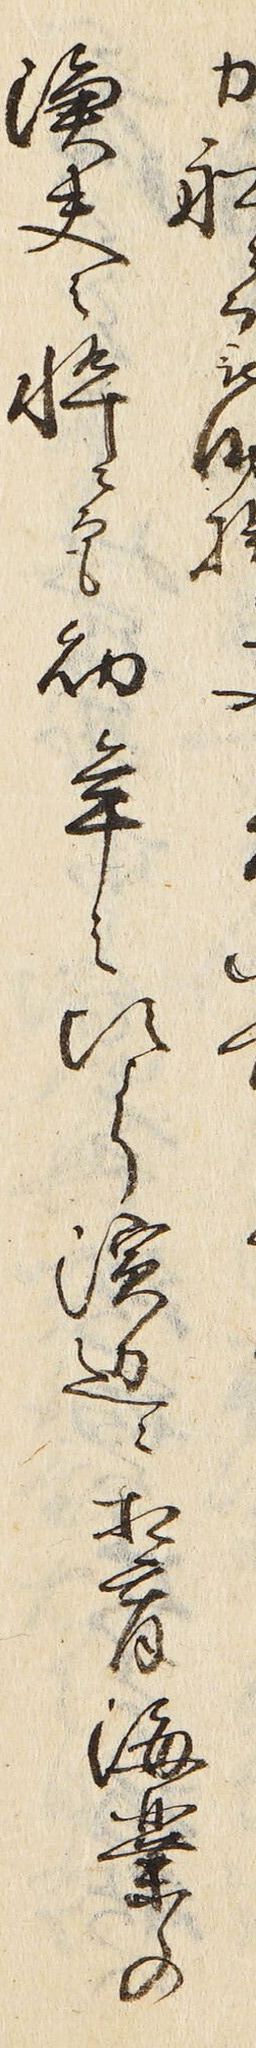漁夫之悴に而も幼年之頃より浜辺に相育海業の
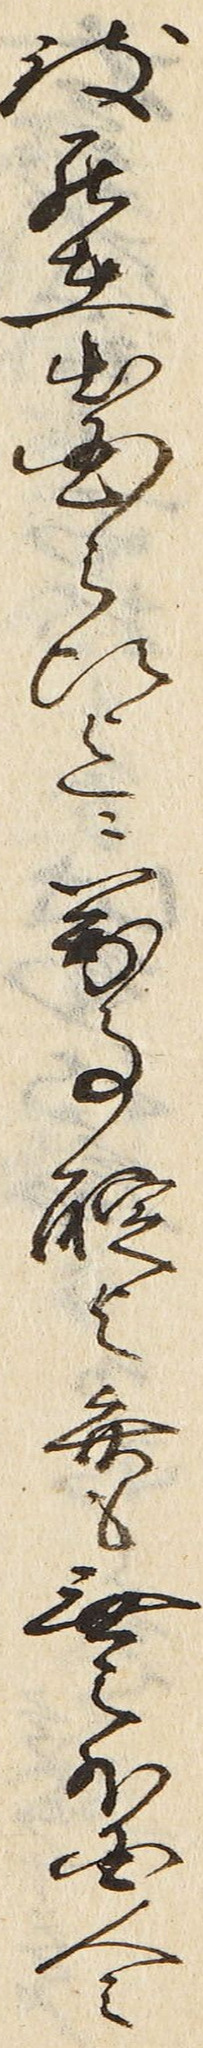致罷在出国被得迄に万事聢与弁も無之外国人之
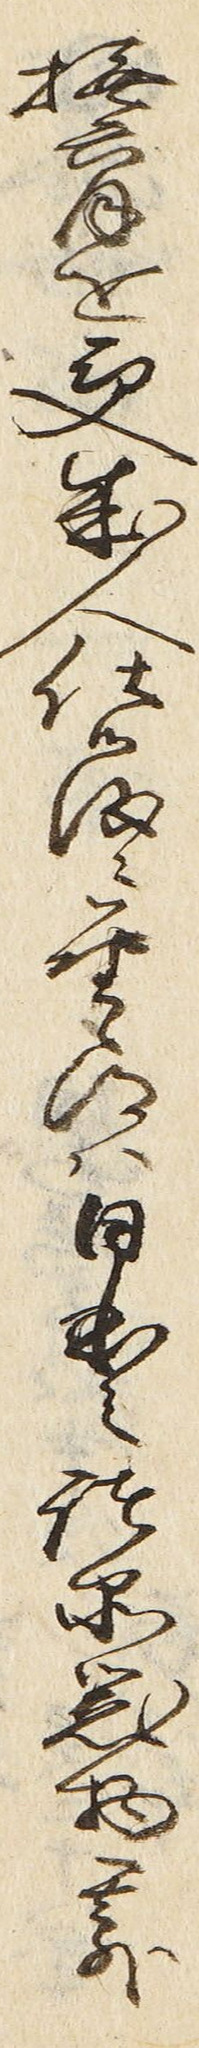撫育を受成人仕候儀に御坐候得は日本之諸品器物其外
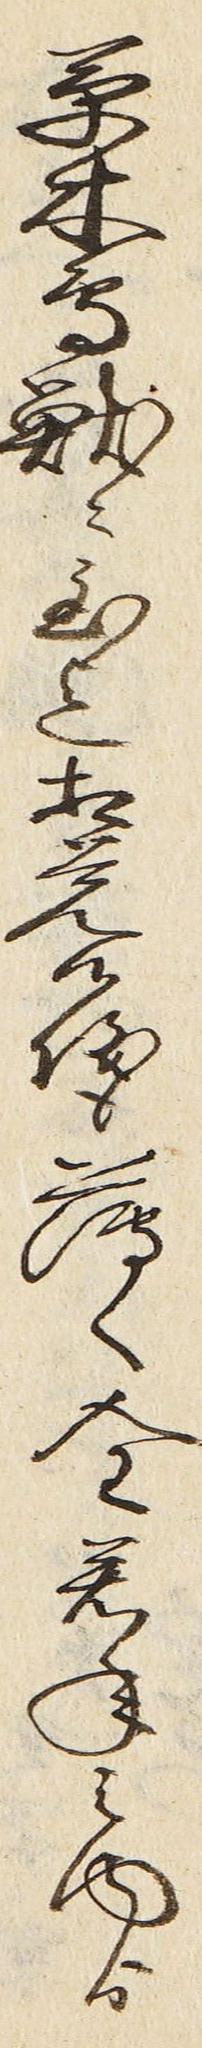草木鳥獣に至迄相覚候儀も薄く全若年之内ゟ
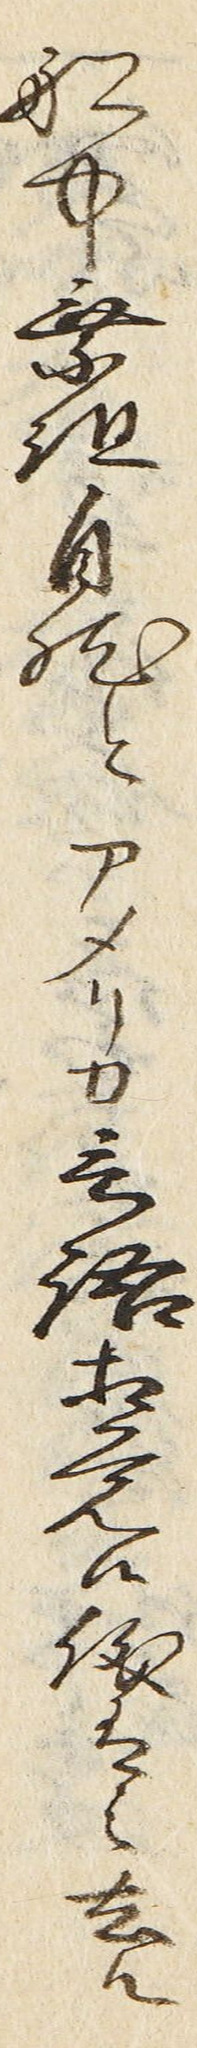船中乗組自然とアメリカ言語相覚候儀有之去る
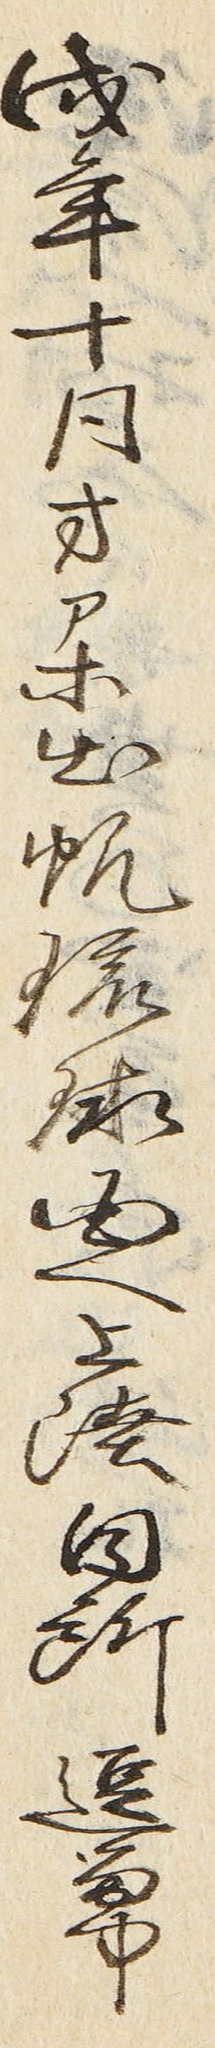戌年十月オアホ出帆琉球国へ上陸同所逗留中
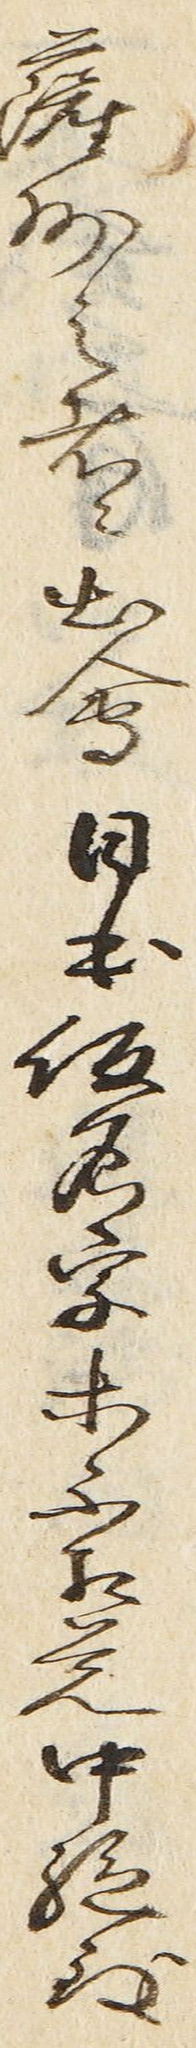薩州之者に出会日本仮名字等不相覚中絶致
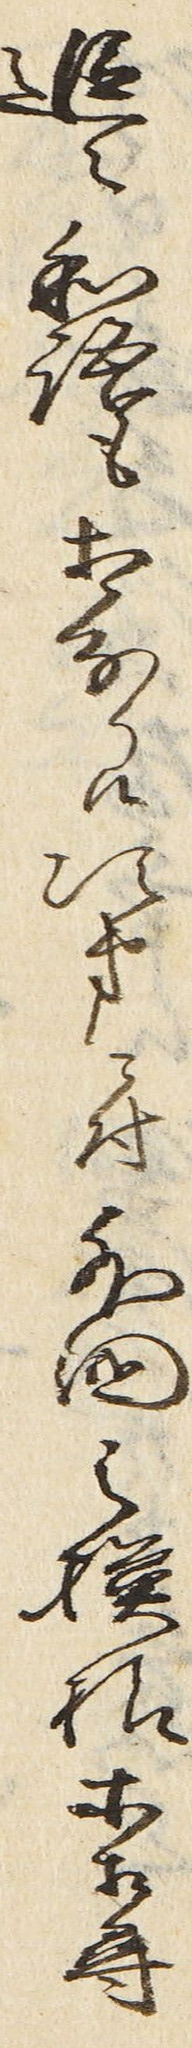追々和語も相分り候次第に付外国之模様抔相尋
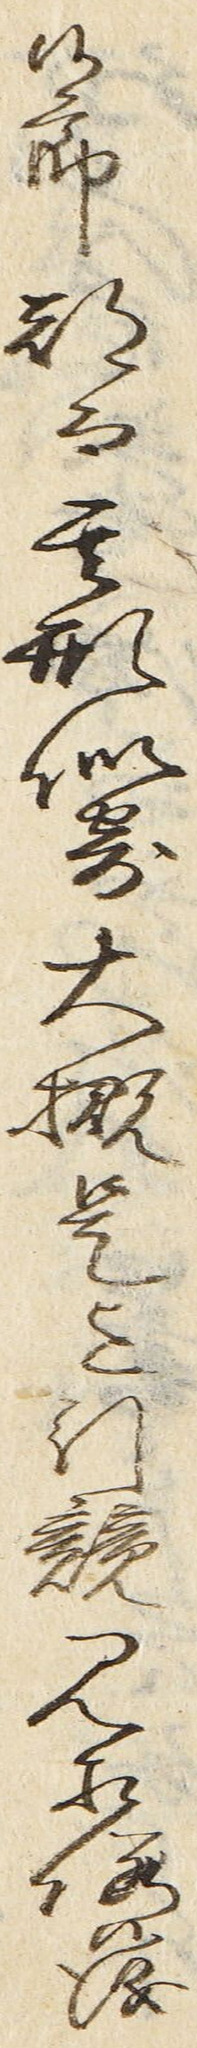候節都而其形似寄大概是迄引競見相例候儀
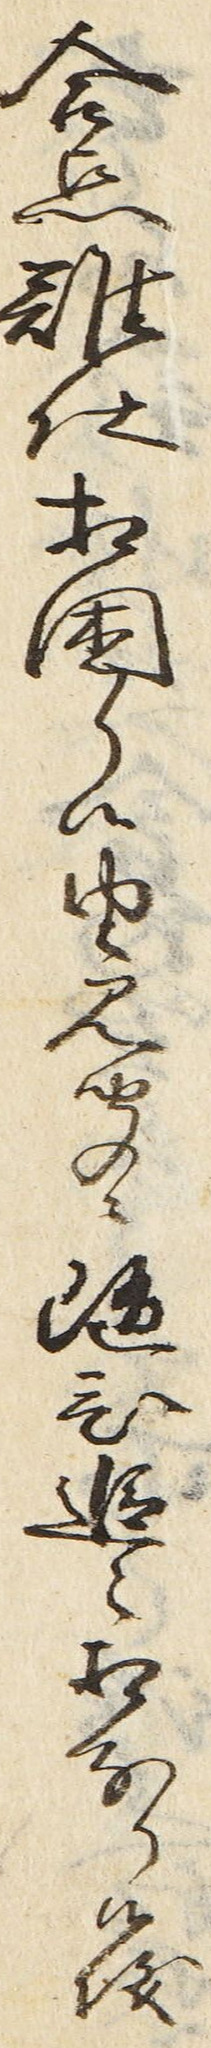合点難仕相困り候由見聞に随ひ追々相分り候儀
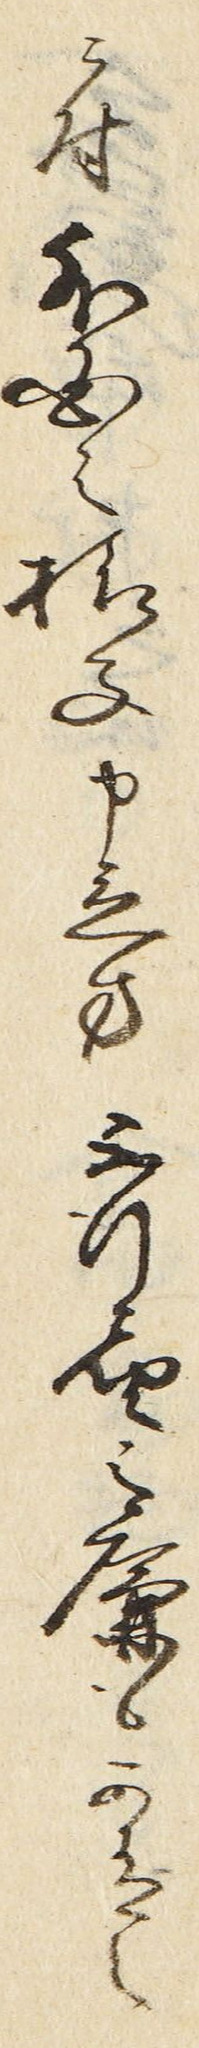に付外国之様子申立方不行届之廉も可有之

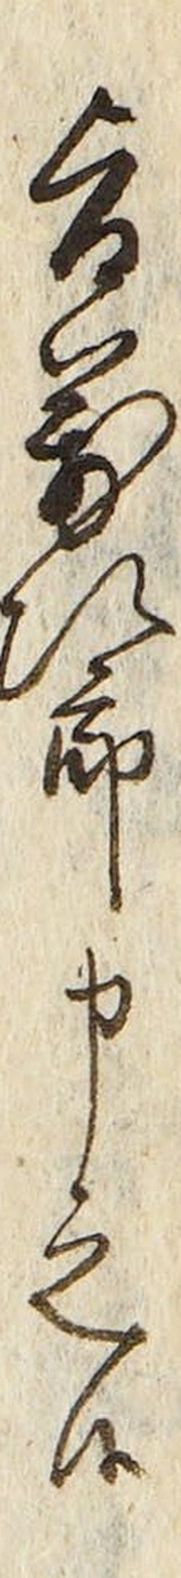旨万次郎申之候
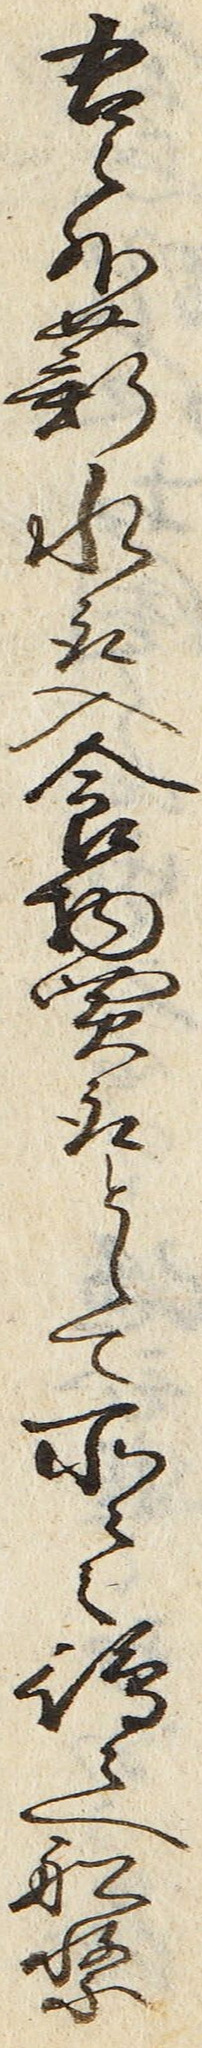右之外薪水取入食物買取として所々之嶋へ船繋
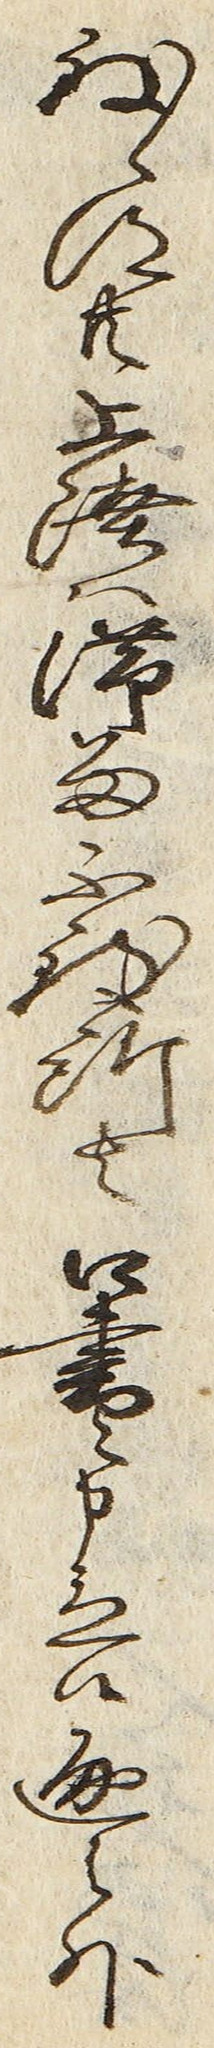致候得共上陸は滞留不致所は口書に申立候通之外
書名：土佐中浜万次郎漂流記
